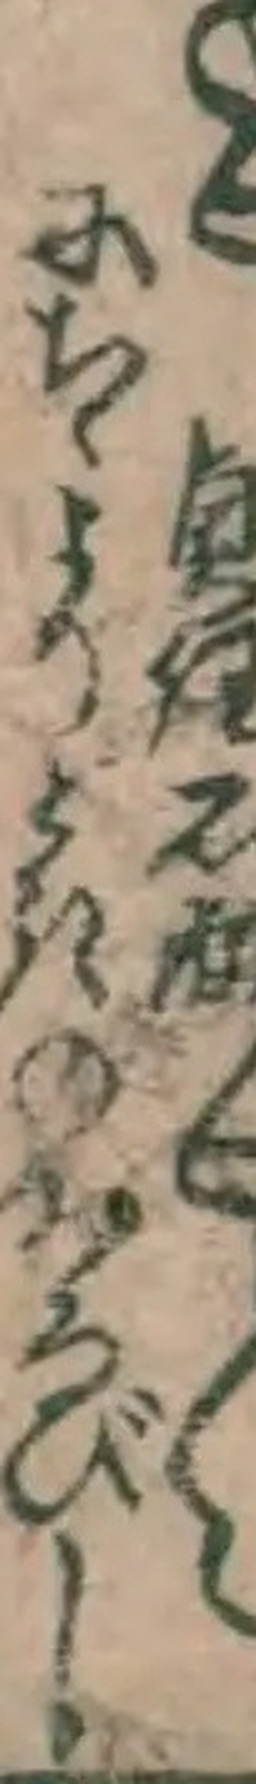に父よりときのほろびし
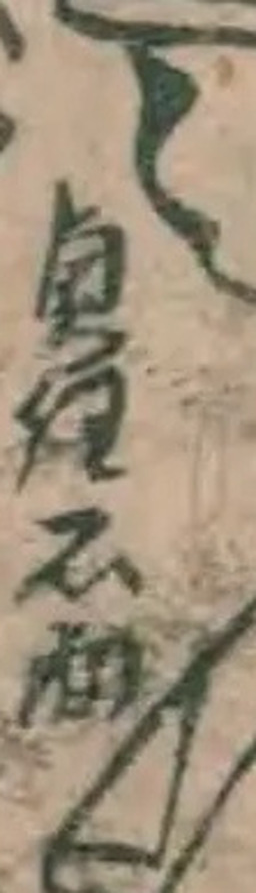貞任石面
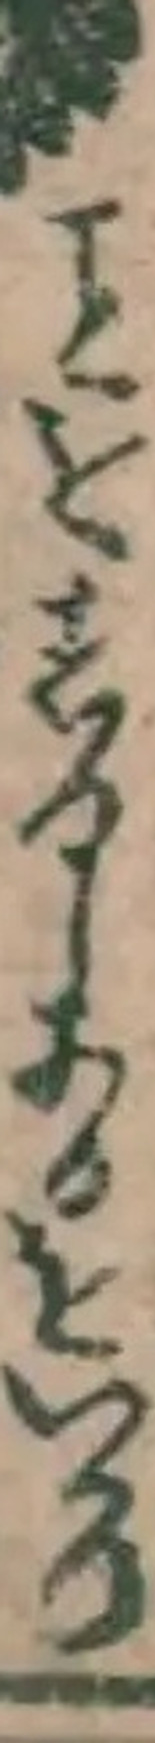ことをしるしあるをいかり
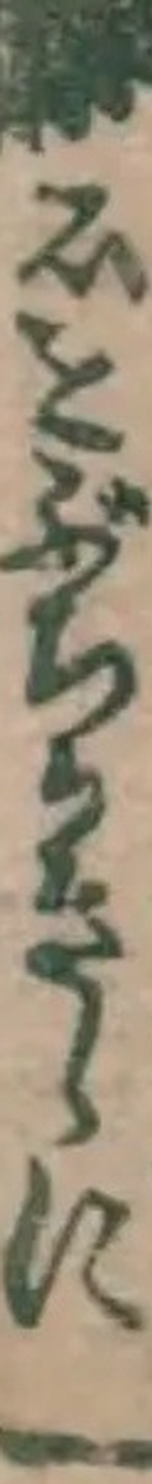石をぶちかきしに
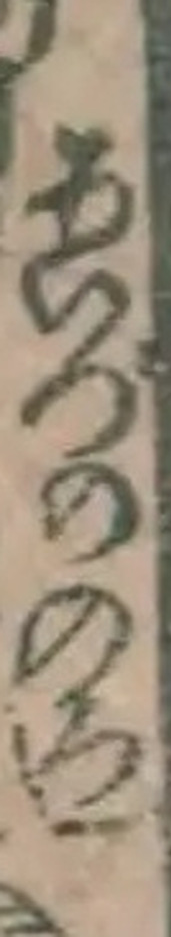あいづののろし
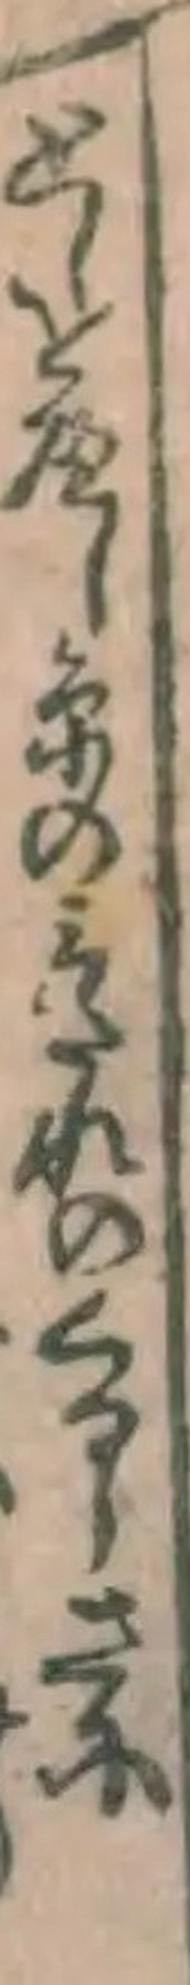としをへし糸のみたれのくるしさに
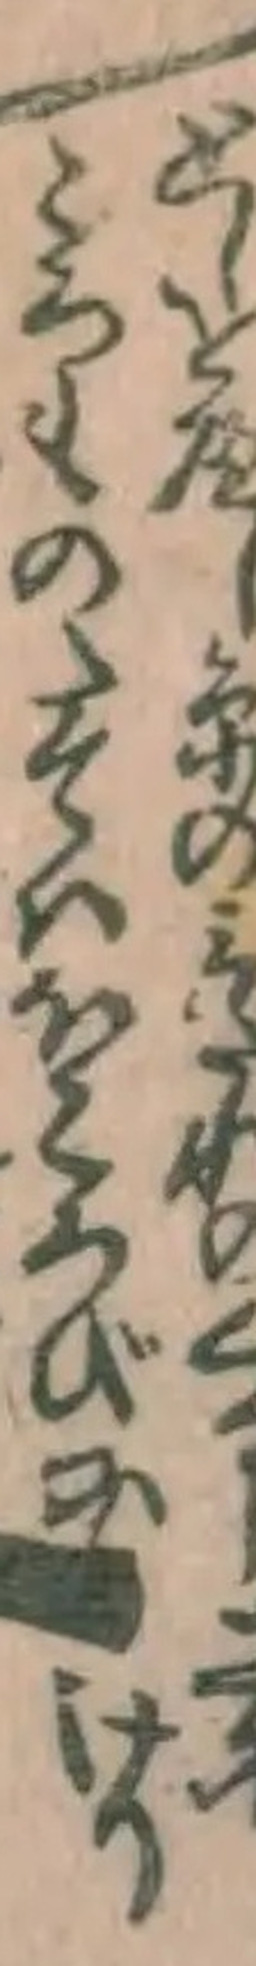ころものたてはほころびにけり
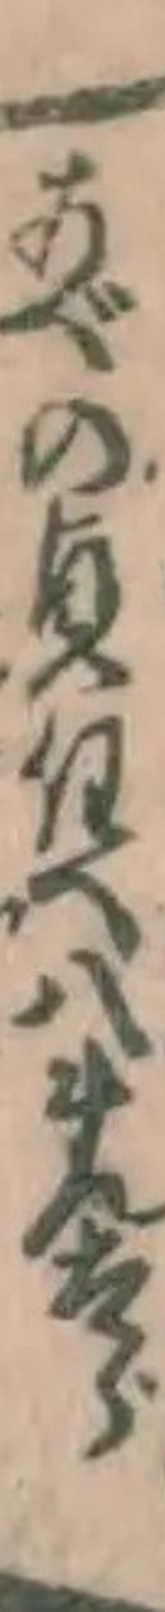あべの貞任へ八まん太郎
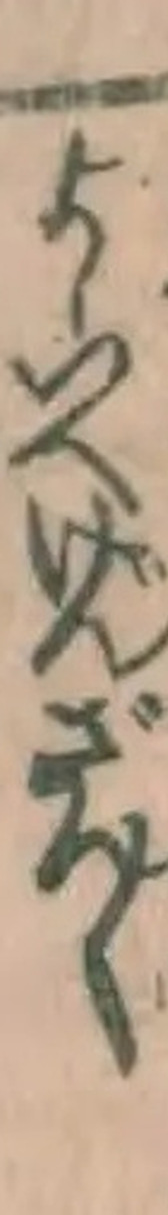よしいへげんざん〳〵
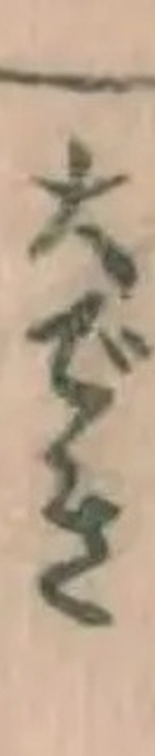大でき
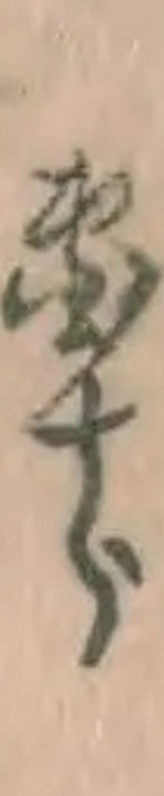團十郎
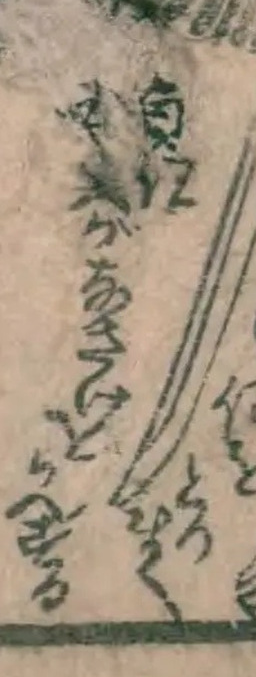国たへがなさけをかんする
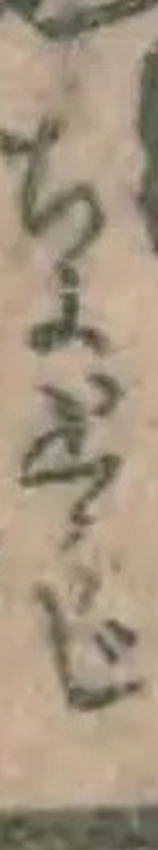ちよどうじ
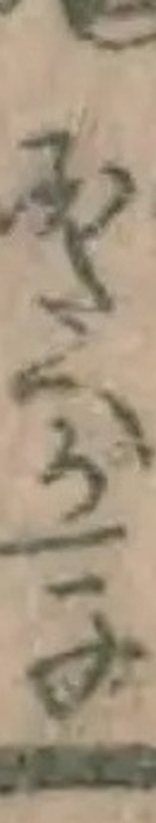国たへが一子
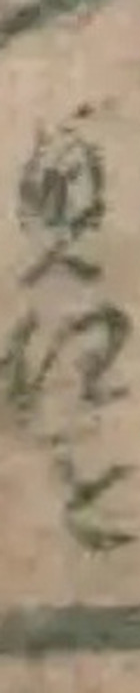貞任を
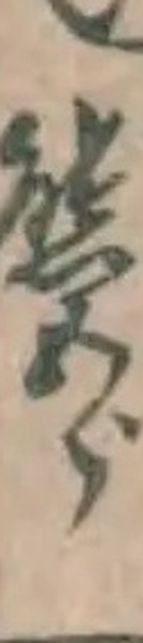淀五郎
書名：伊達錦對将 : 森田座
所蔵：国立国会図書館 National Diet Library, JAPAN
